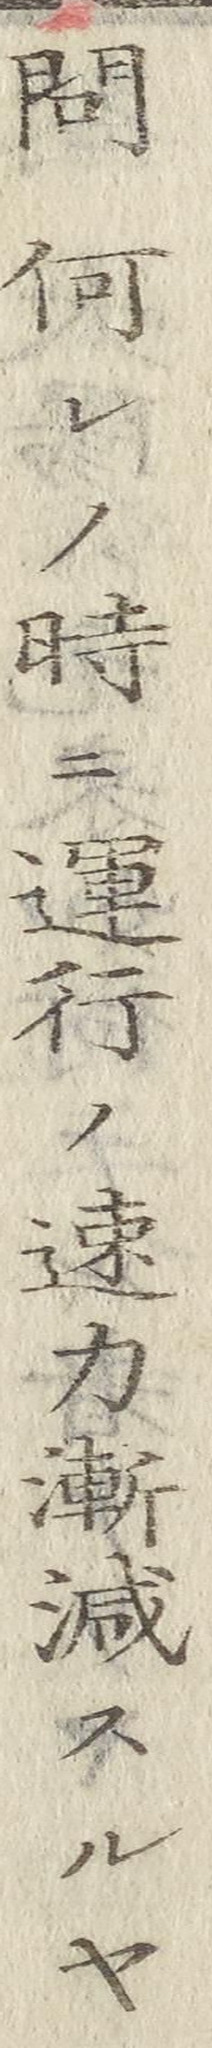問何レノ時ニ運行ノ速力漸減スルヤ
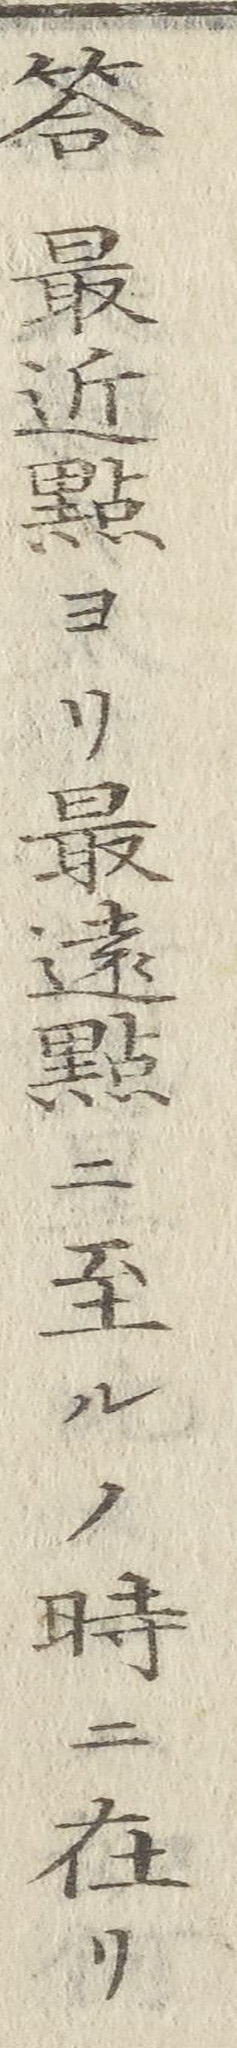答最近点ヨリ最遠点ニ至ルノ時ニ在リ
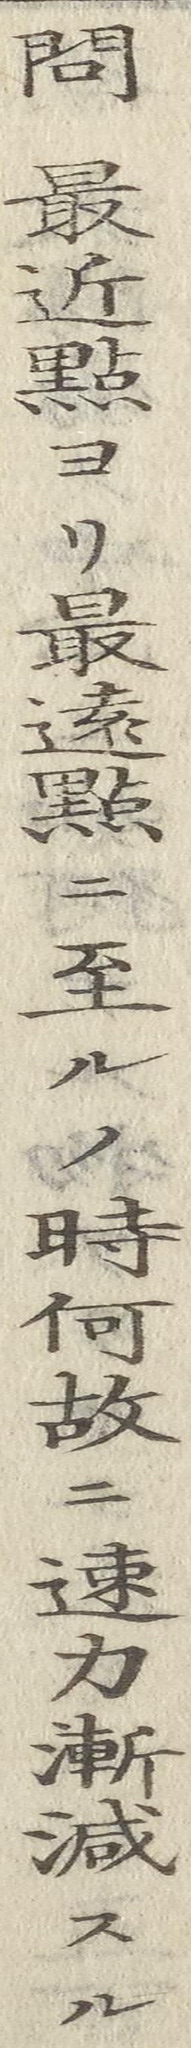問最近点ヨリ最遠点ニ至ルノ時何故ニ速力漸減スル
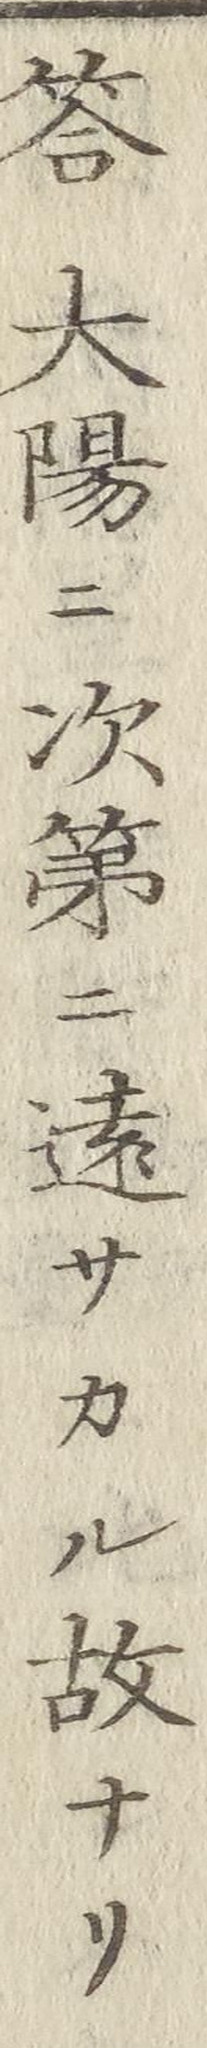答大陽ニ次第ニ遠サカル故ナリ
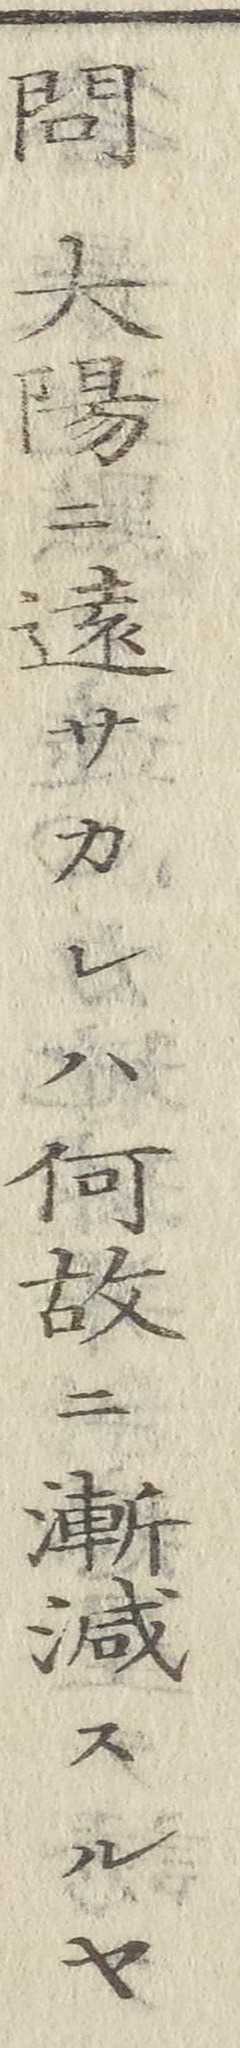問大陽ニ遠サカレハ何故ニ漸減スルヤ

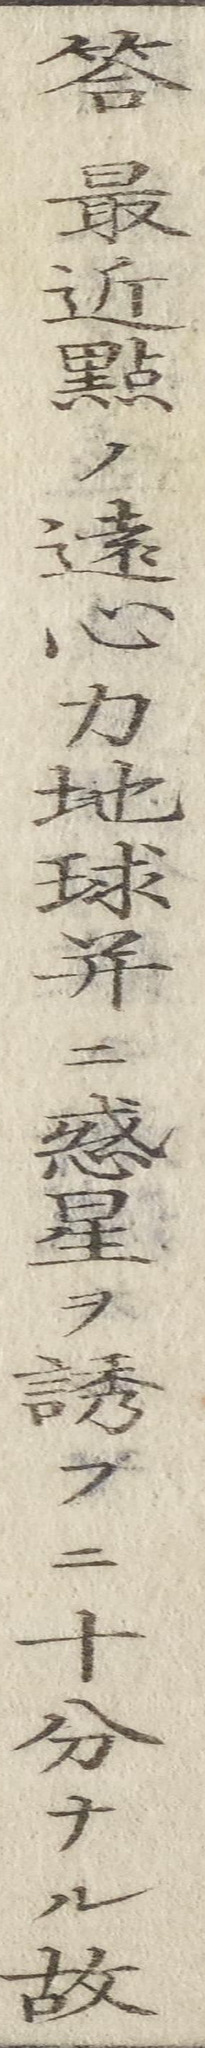答最近点ノ遠心力地球幷ニ惑星ヲ誘フニ十分ナル故
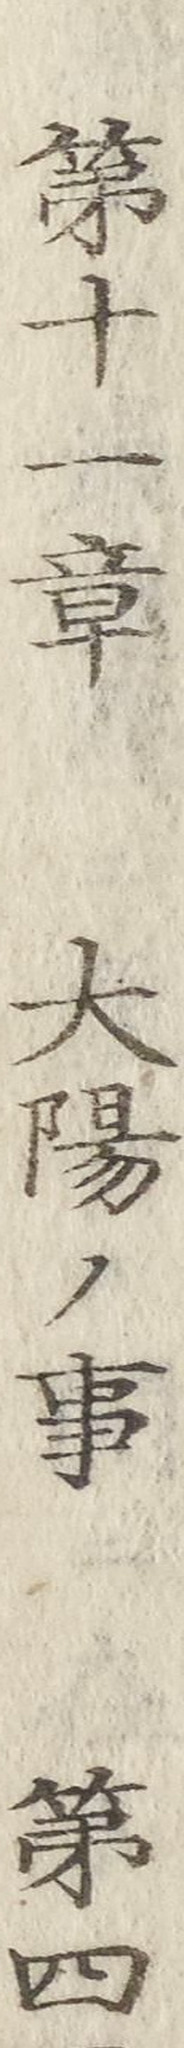第十一章大陽ノ事第四図
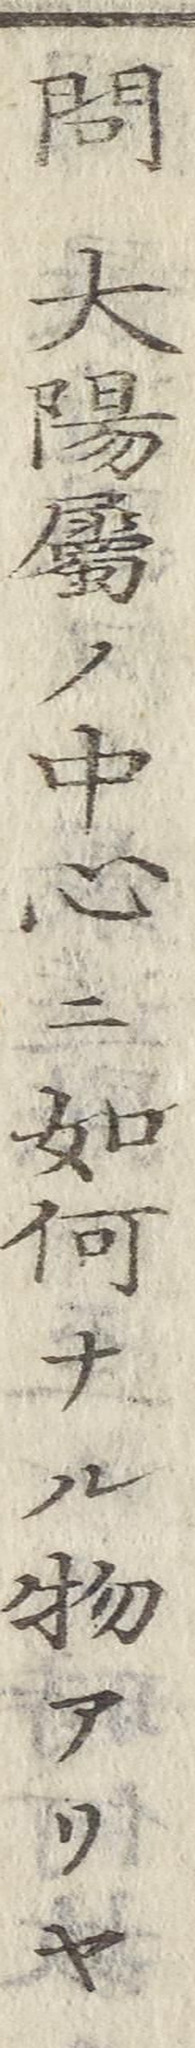問大陽属ノ中心ニ如何ナル物アリヤ
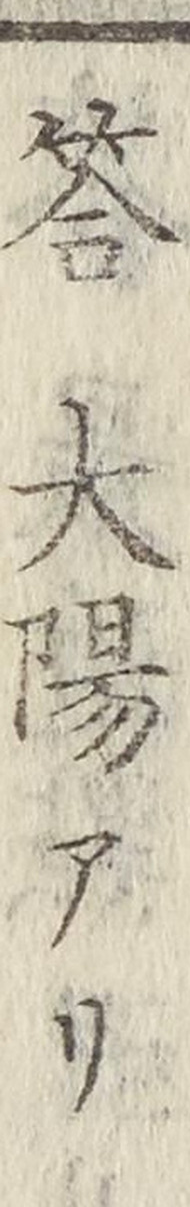答大陽アリ
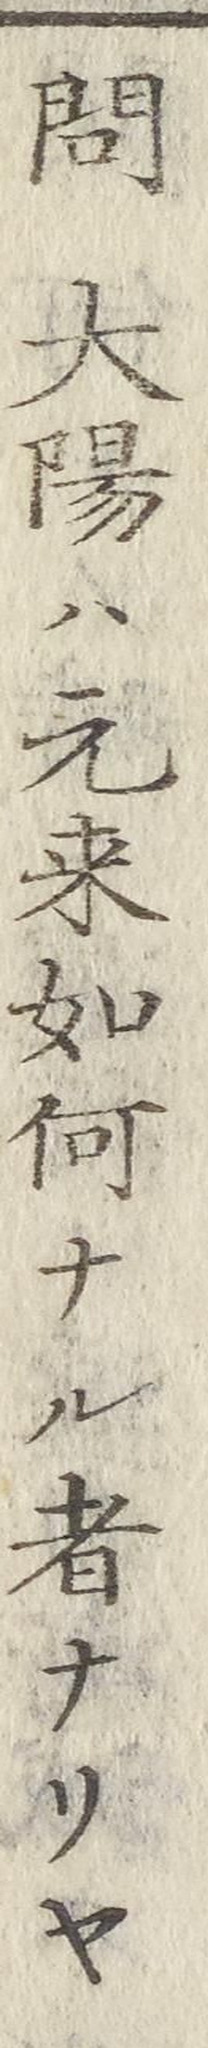問大陽ハ元来如何ナル者ナリヤ
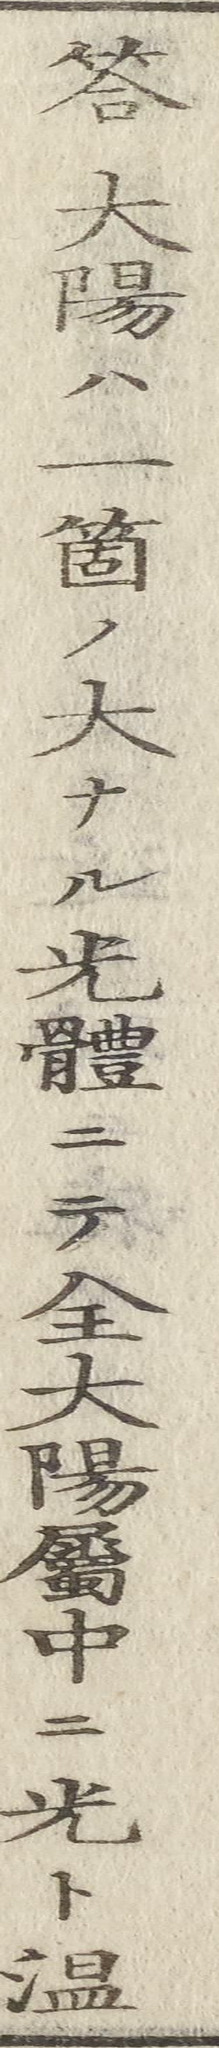答大陽ハ一個ノ大ナル光体ニテ全大陽属中ニ光ト温
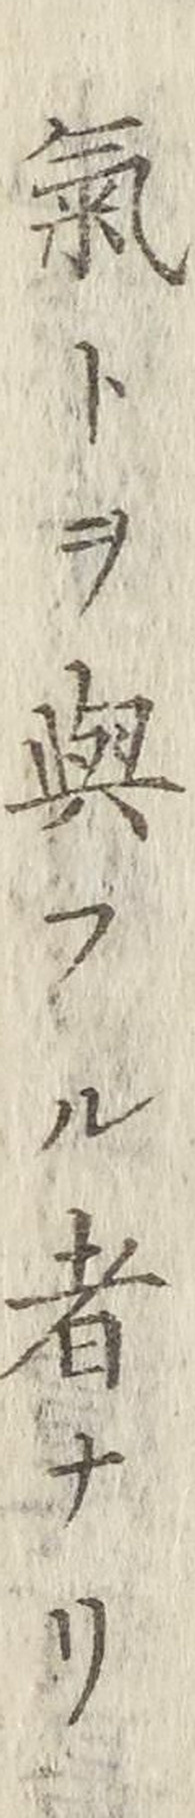気トヲ与フル者ナリ
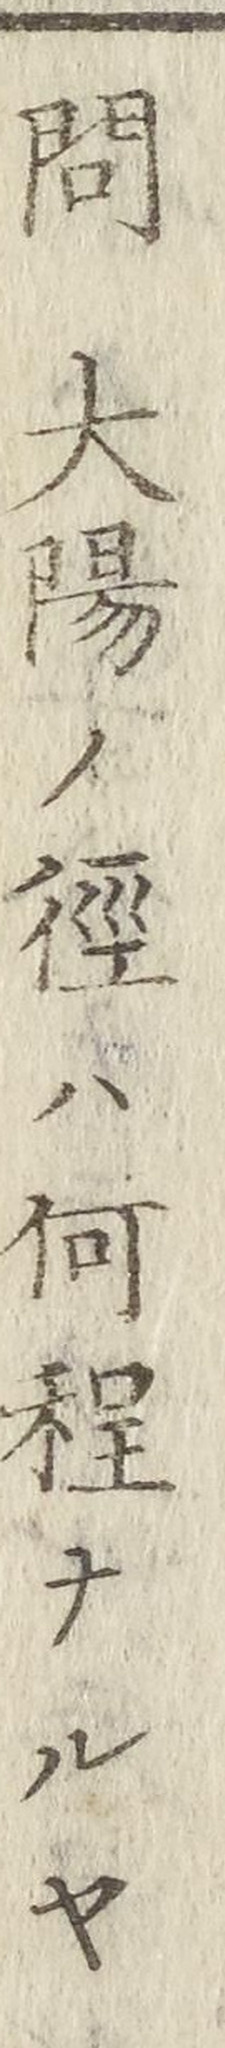問大陽ノ径ハ何程ナルヤ
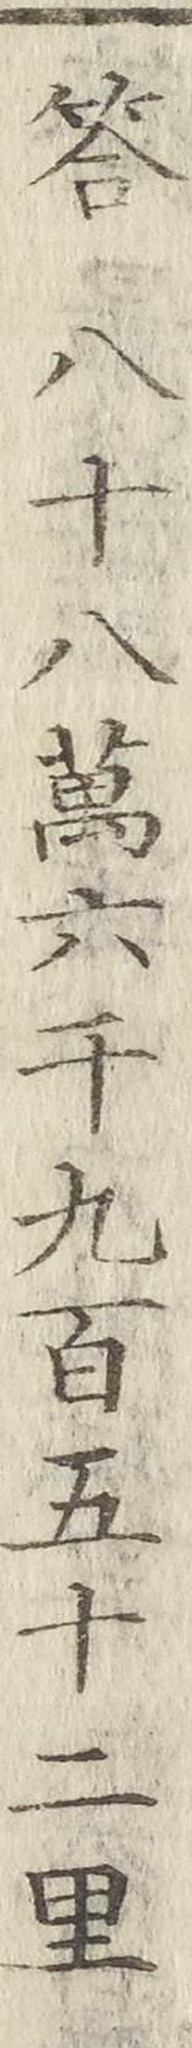答八十八万六千九百五十二里
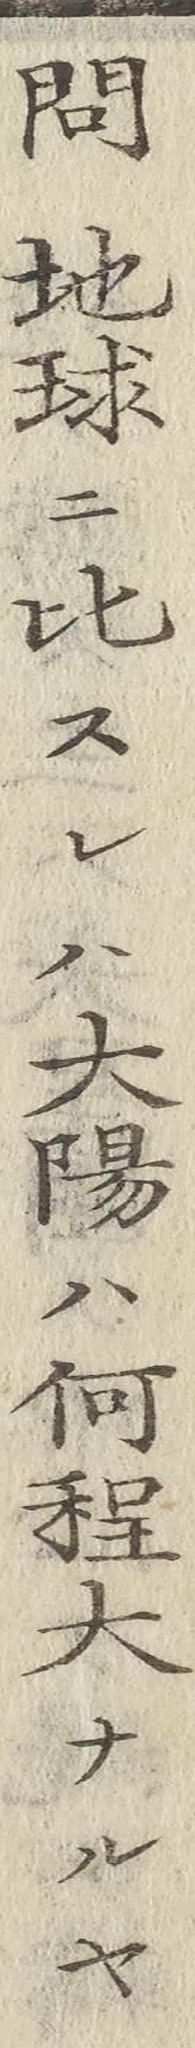問地球ニ比スレハ大陽ハ何程大ナルヤ
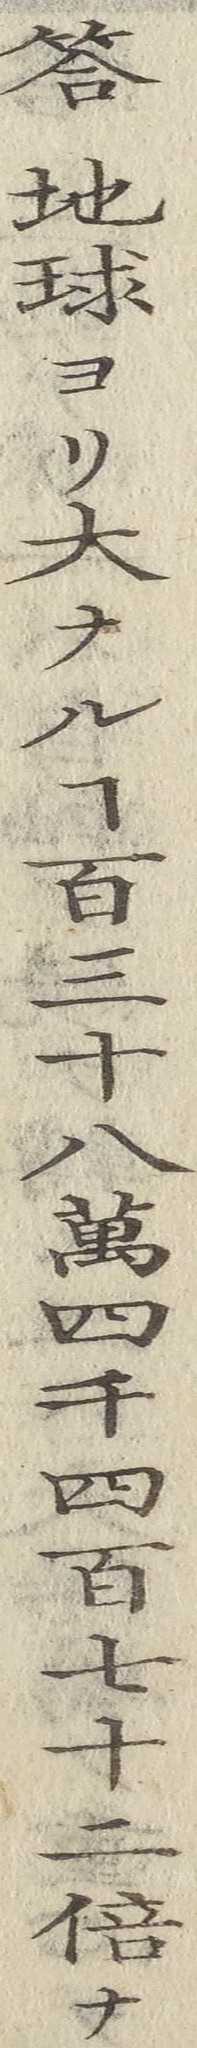答地球ヨリ大ナルコト百三十八万四千四百七十二倍ナ
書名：星学圖説　上
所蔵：東京大学地震研究所図書室 Earthquake Research Institute Library, The University of Tokyo, JAPAN
